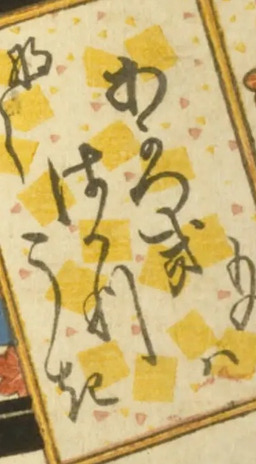あかつき
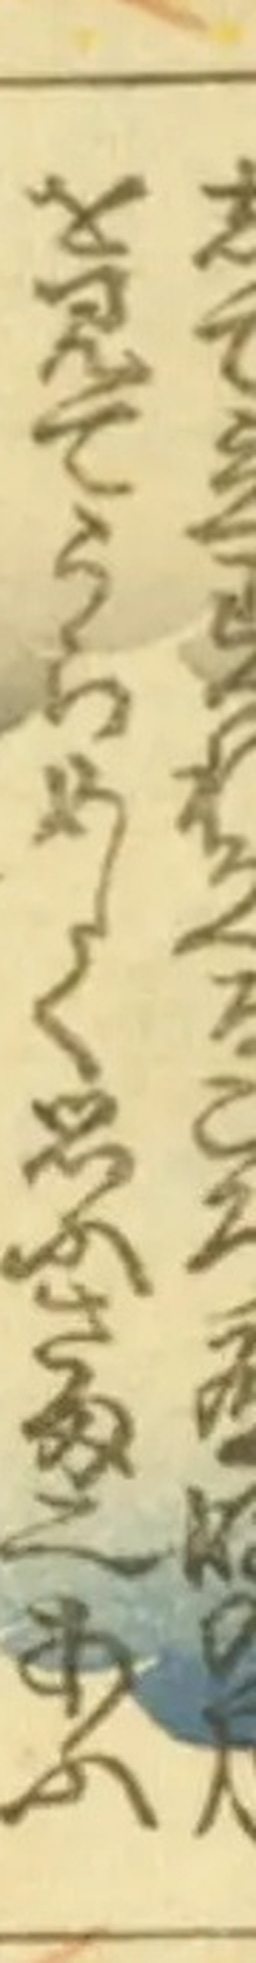を見てうらめしく思ふさま也あふ
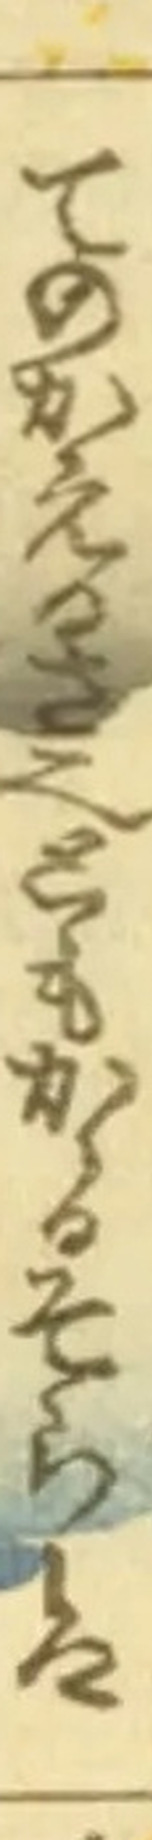てのかえるさ也ともかゝるそらは
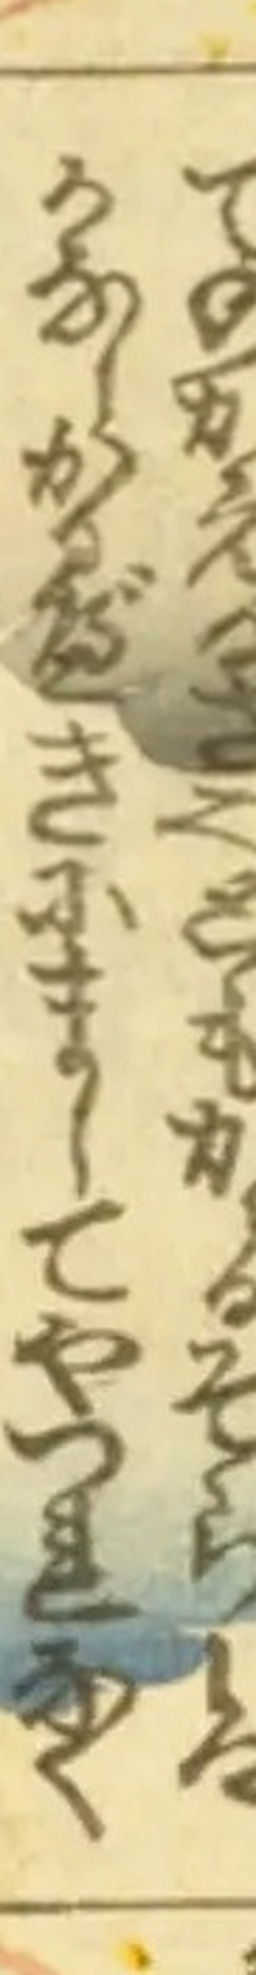かなしかるべきにましてやつれなく
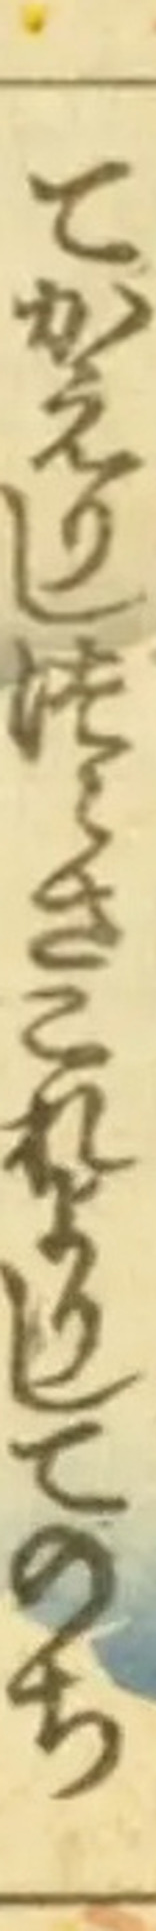てかえりしつらさこれよりしてのち
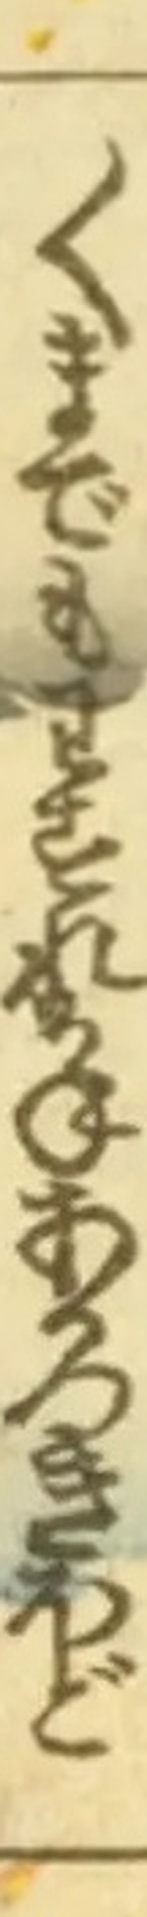〳〵までもわすれかねあかつきほど
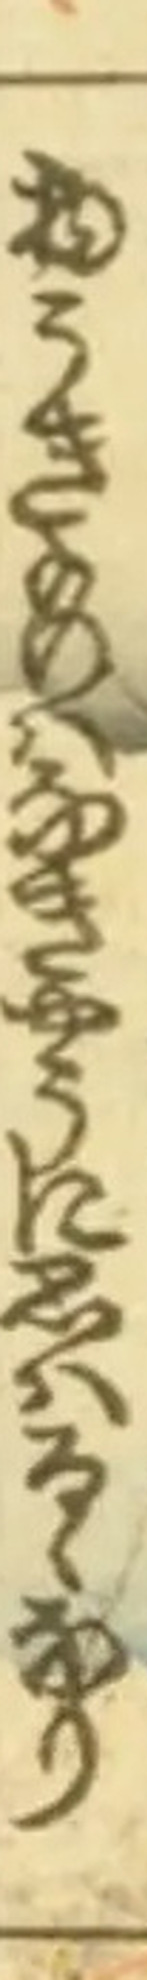物うきものはなきやうに思はるゝなり
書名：百人一首絵抄 三十七 壬生忠峯
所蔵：国立国会図書館 National Diet Library, JAPAN
